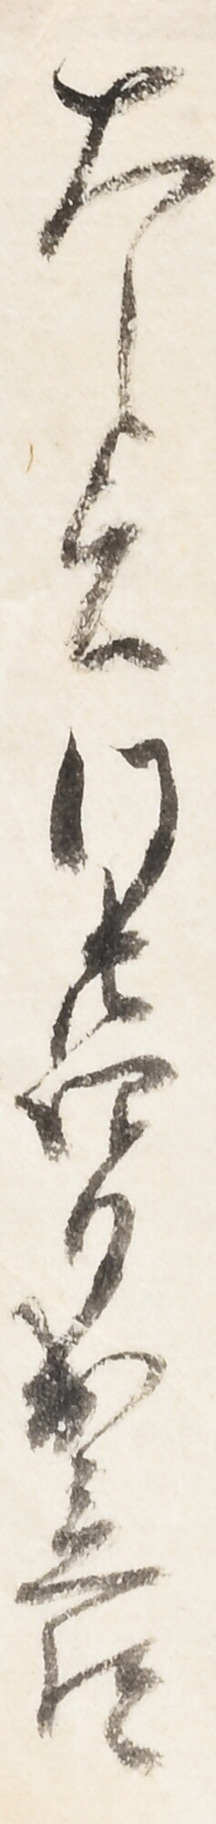右之者同廿四日出立仕候
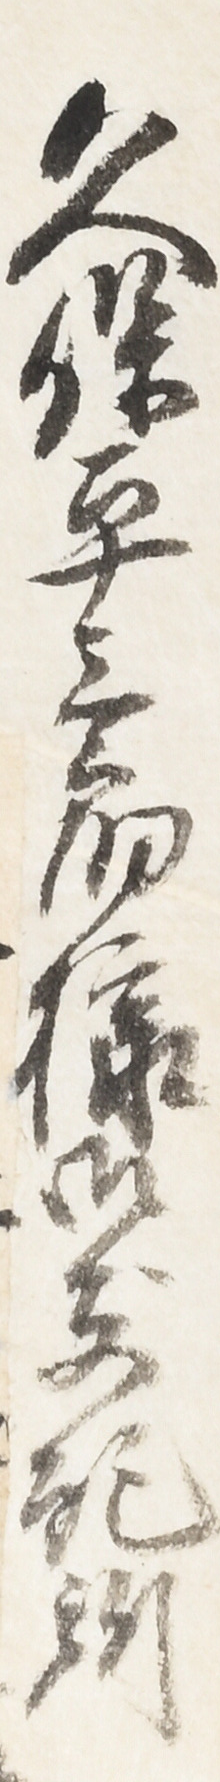久保平三郎様御支配所
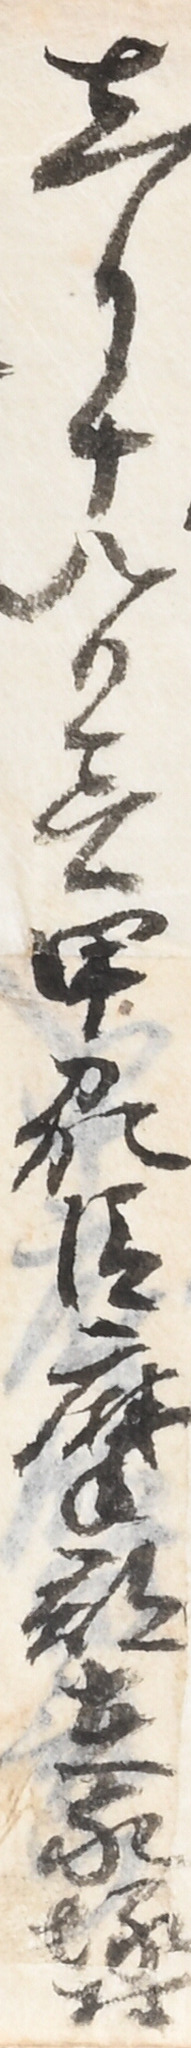十二月十八日着甲州巨摩郡在家塚村
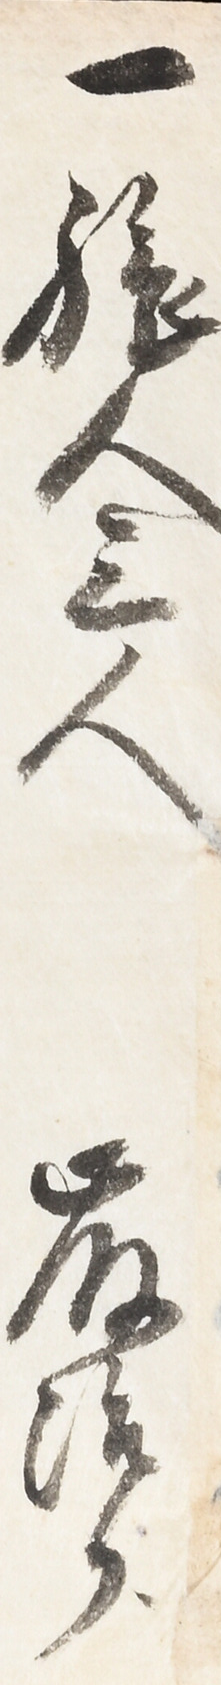一旅人三人藤治郎
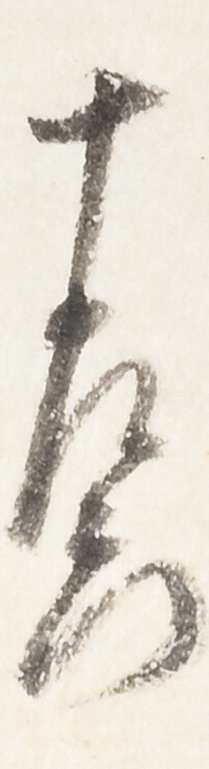十左衛門
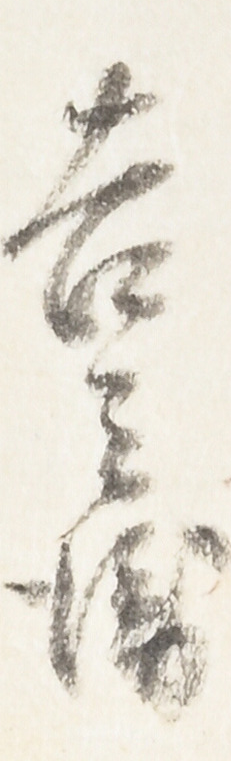吉兵衛
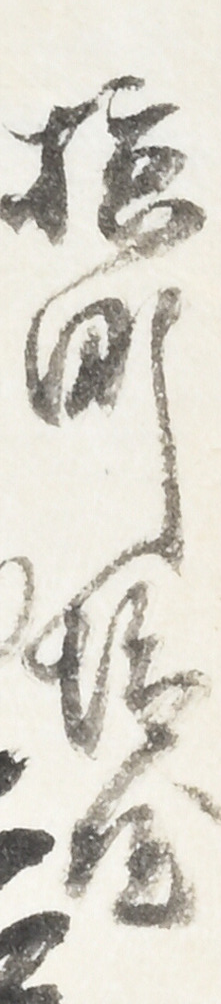横町塩屋
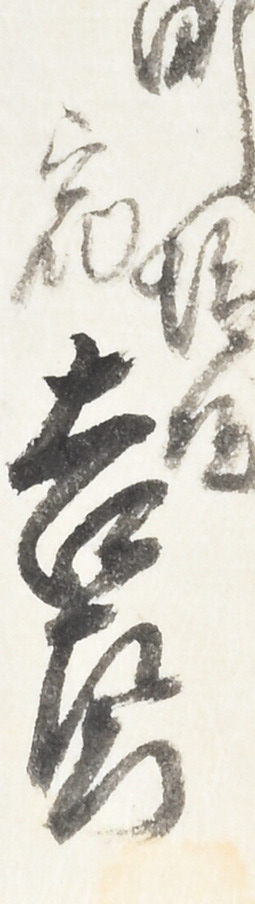宿吉左衛門
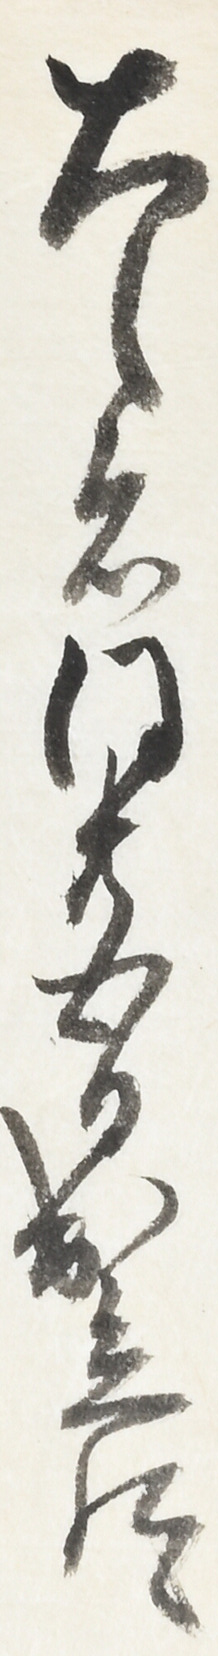右之者同廿五日出立仕候

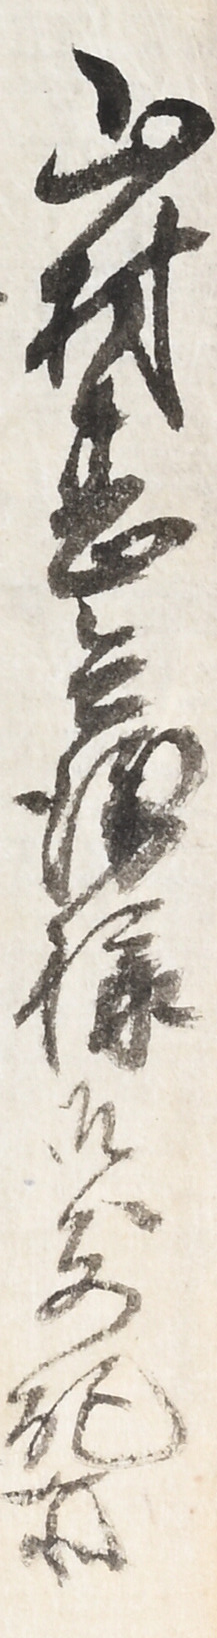山村甚兵衛様御支配所
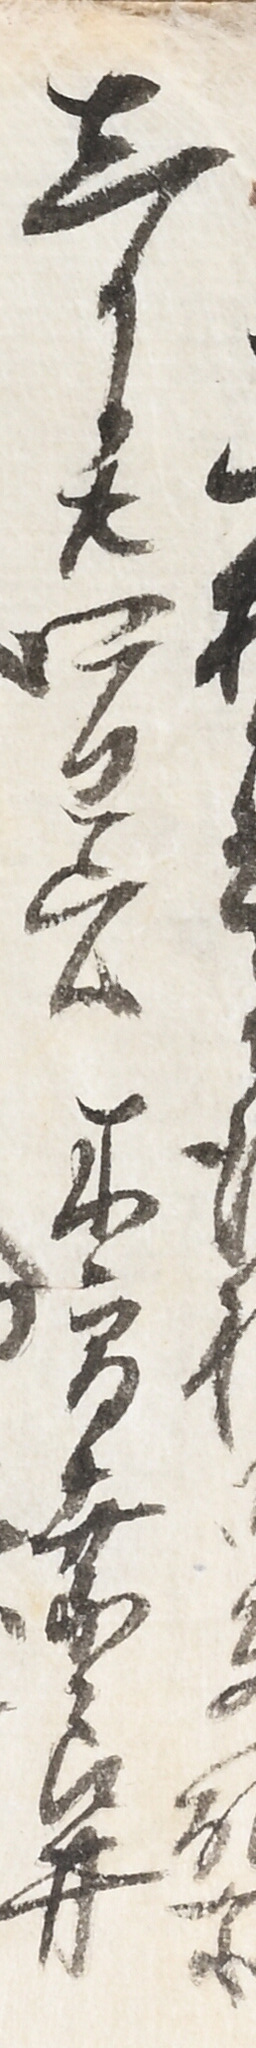十二月廿四日着木曽奈良井
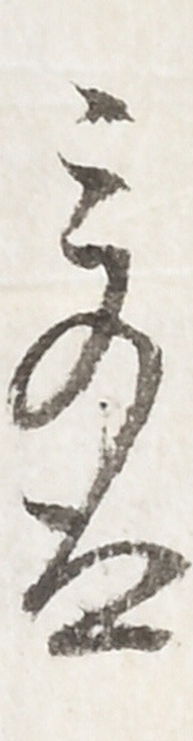みのや
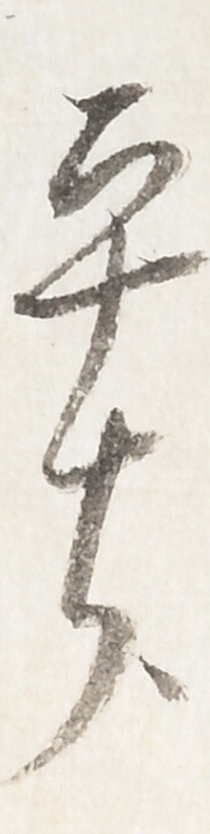平十郎
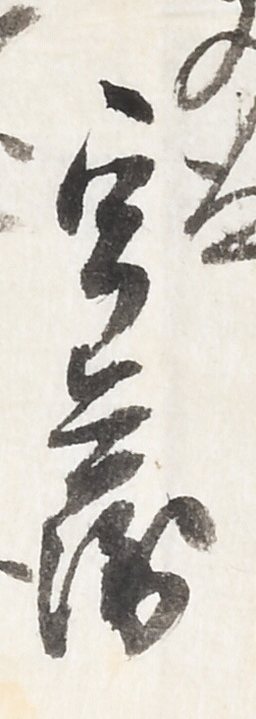宇兵衛
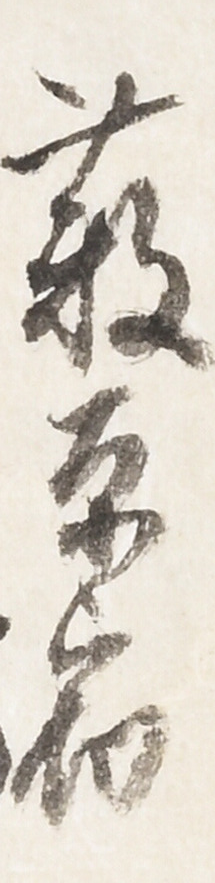藪原宿
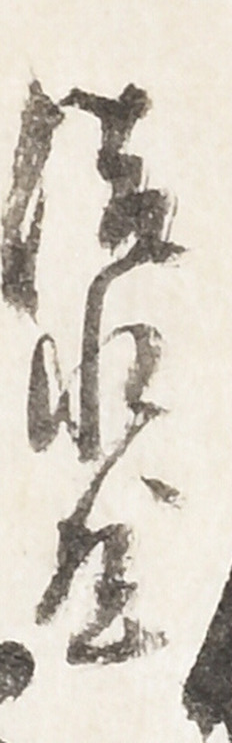清水屋
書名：旅人泊控帳
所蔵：伊那市立高遠町図書館・合同会社AMANE
